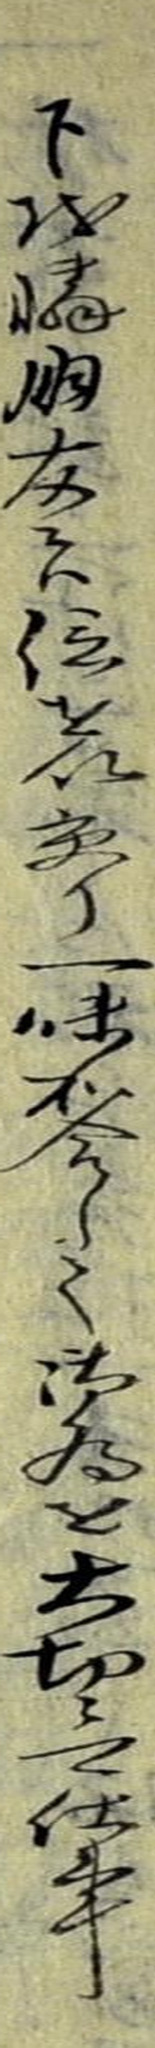下を憐朋友ニハ信を以交り一味和合して御為を大切ニ可仕事
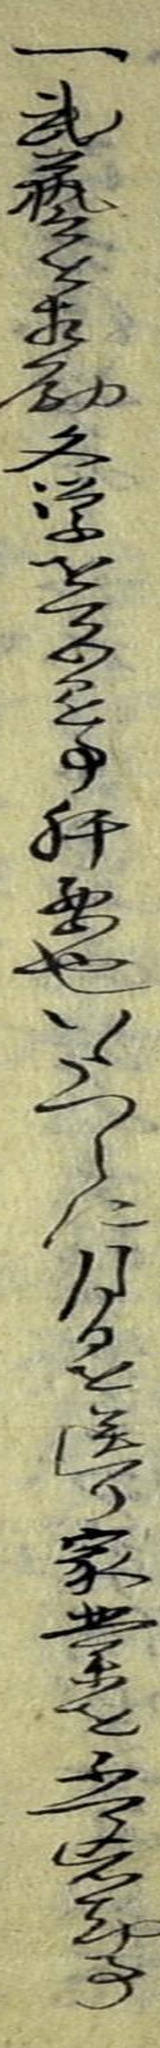一武芸を相励文学を可心懸事肝要也いたつらに月日を送り家業を不可忘却事
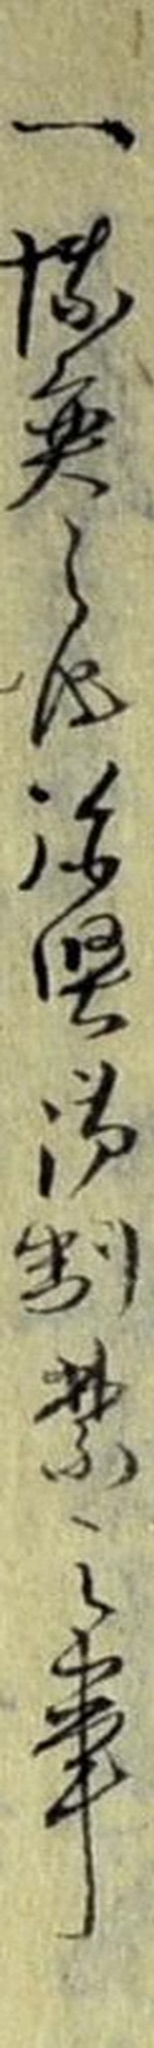一博奕之儀弥堅御制禁之事
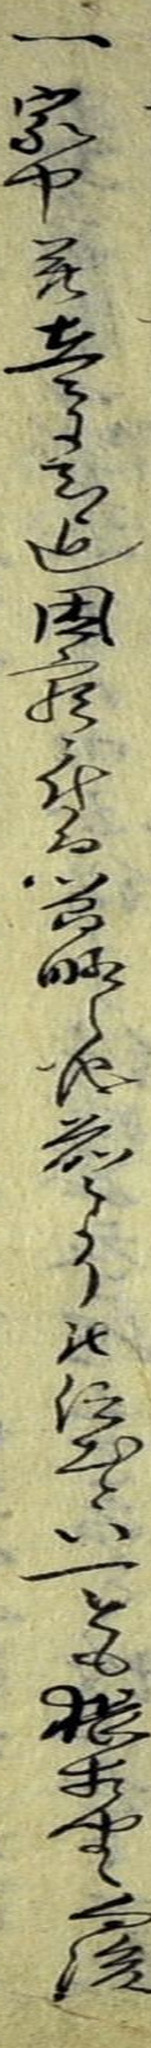一家中并在々に至迄困窮ニ付而簡略之儀前々より被仰出といへとも猥相聞候向後
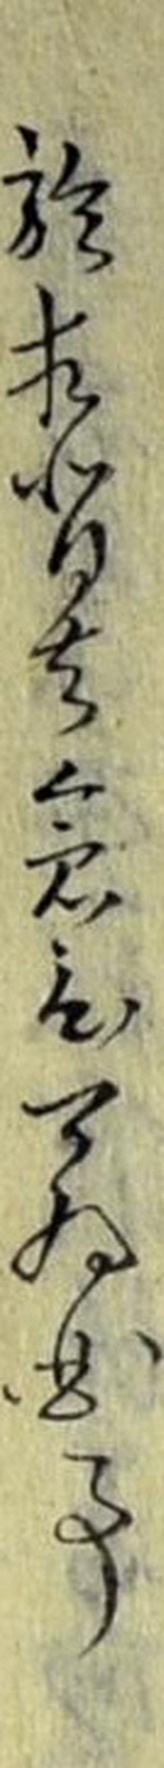於相背者急度可為曲事
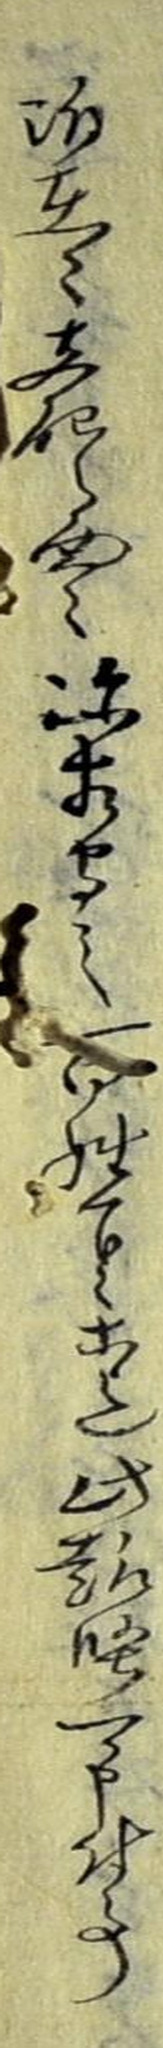附在々支配之面々弥相守之百姓下々等迄此趣堅可申付事

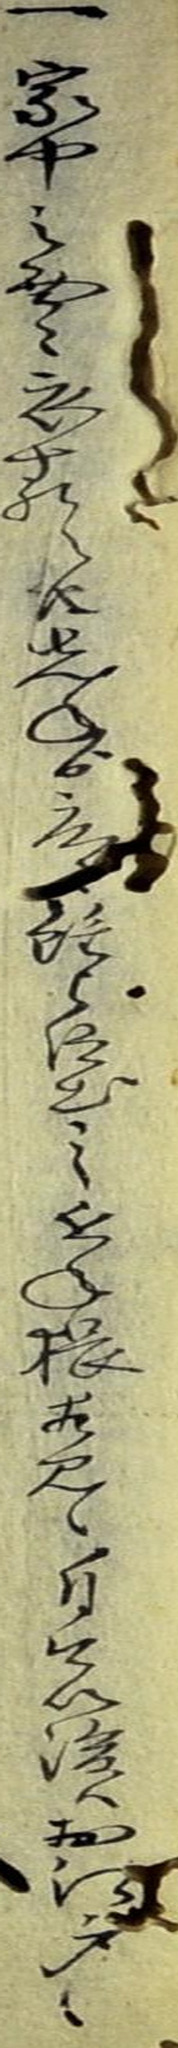一家中之面々衣類之儀先年ゟ度々雖被仰出之近年猥相見候自今以後ハ於江戸
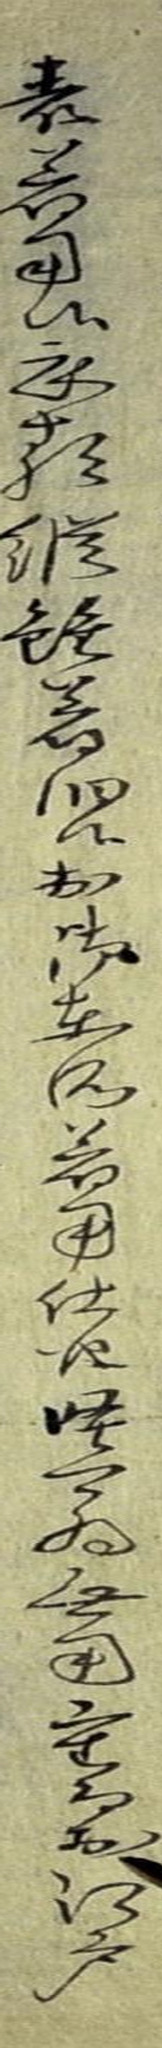表着用候衣類縦雖着旧候於御在所着用仕儀堅可為無用重而於江戸
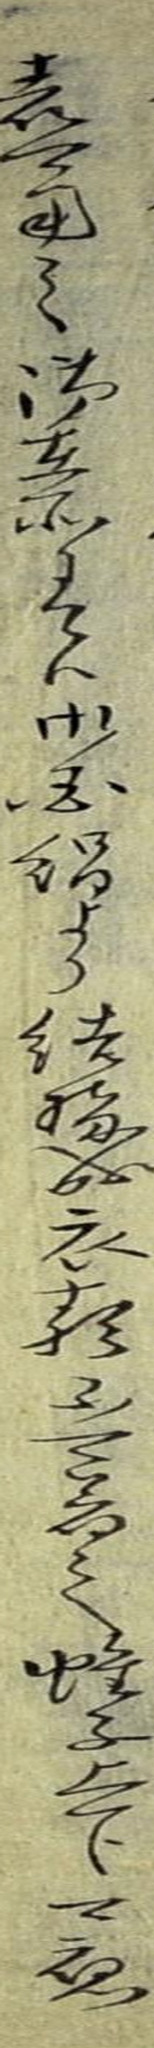表可用之御在所にてハ於国絹より結構成衣類不可着之帷子上下可応
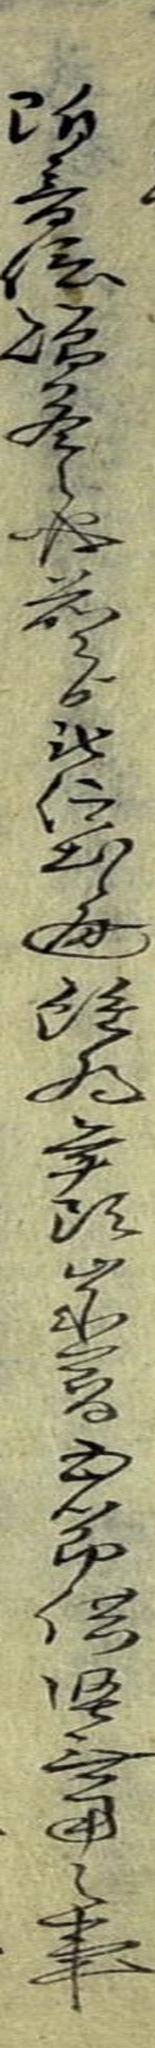附音信贈答之儀前々ゟ被仰出候通雖為年頭歳暮五節供堅無用之事
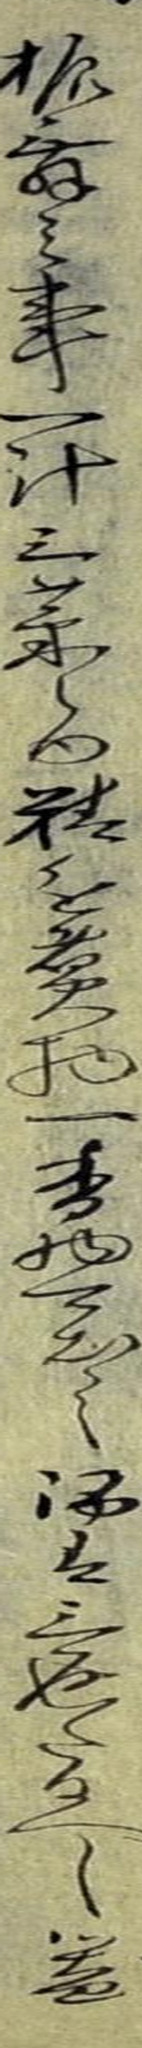一振舞之事一汁三菜之内精進煮物一香物可出之酒は三返たるへし御盃
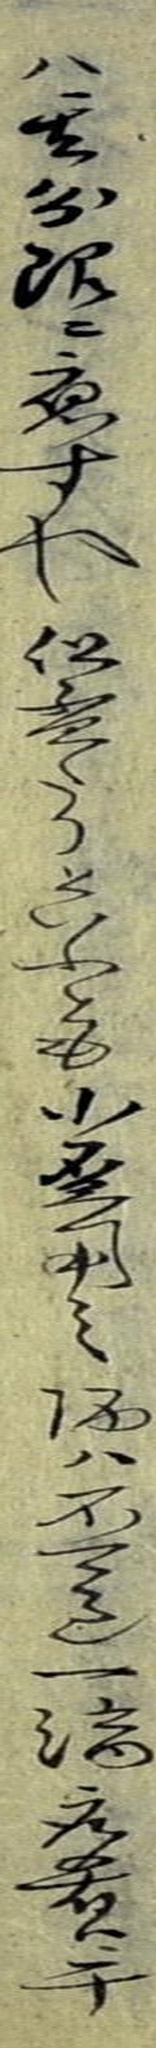ハ其分限ニ応すへし但盃たりといふとも小盃用之酒ハ不可過一滴取肴ハ干
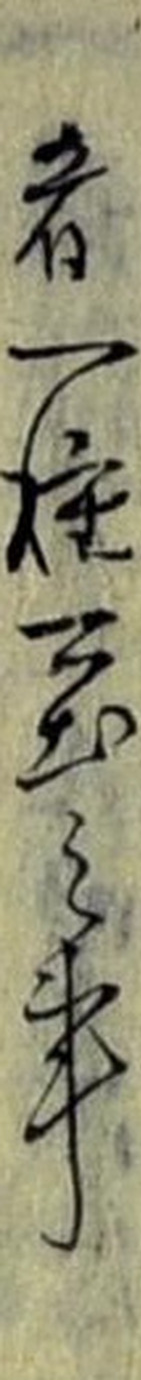肴一種可出之事
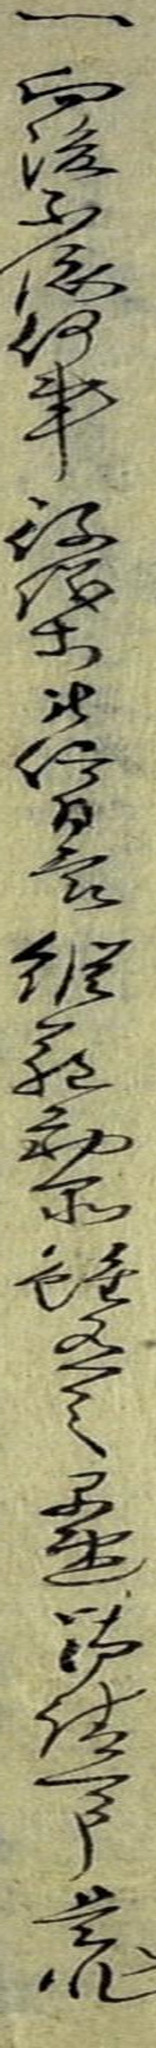一向後不依何事役儀等被仰付節縦難勤所雖有之早速御請可申是非
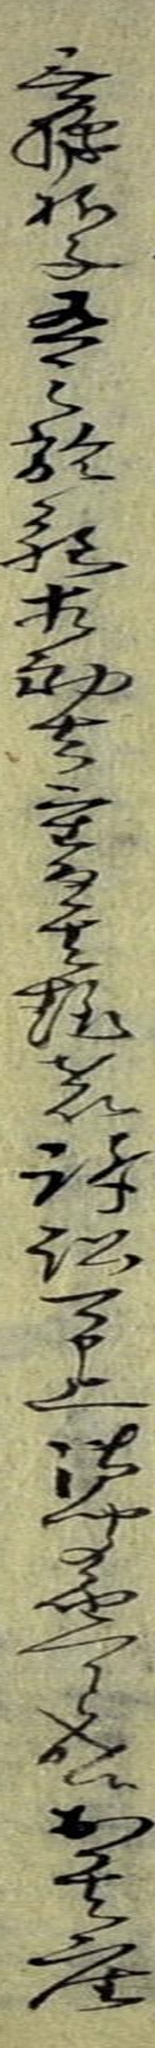無拠様子有之於難相勤者重而其趣を以訴訟可申上御聞届可被成候於其座
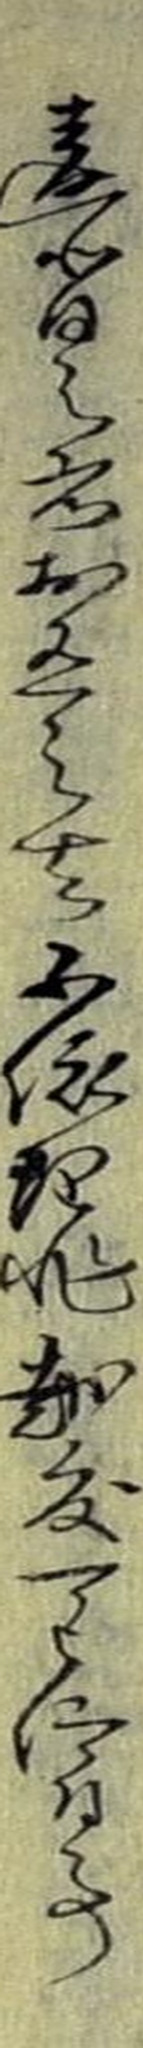違背之者於有之者不依理非越度可被仰付事
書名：命令之部 一
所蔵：福井県文書館 Fukui Prefectural Archives
